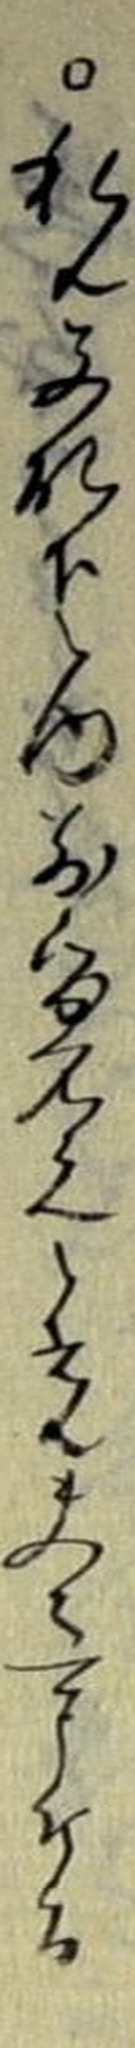〇私共支配下之内別紙名元之者共夫々可申付旨
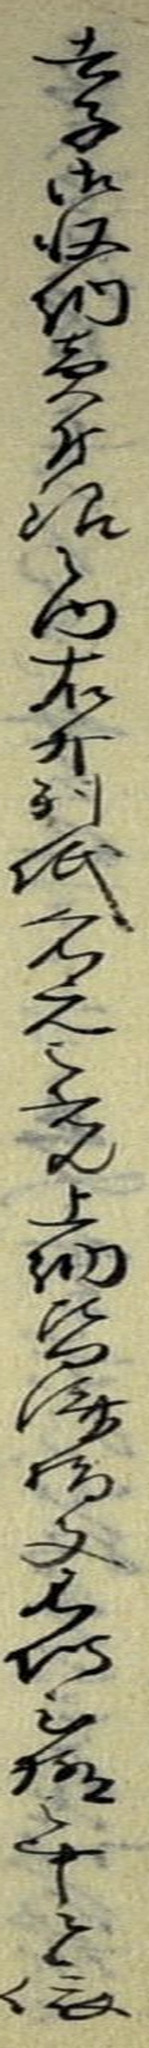去子御収納売付銀之内右村別紙名元之者共上納皆済指支不埒至極之事に候依
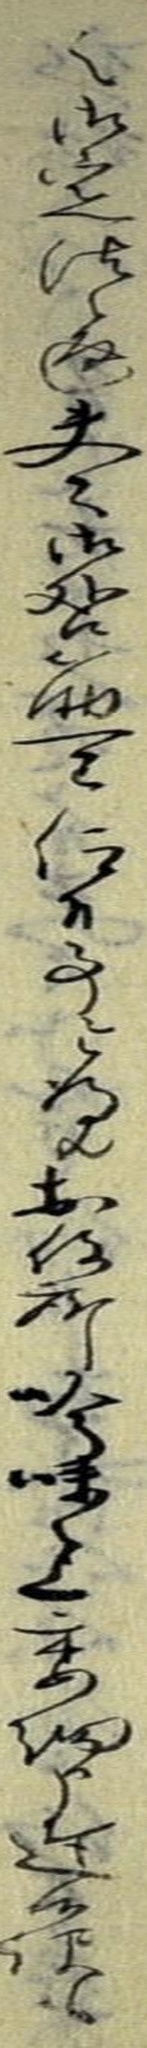之御定法之通夫々御咎筋可被仰付事に候共於役所吟味之上委細申達候訳も
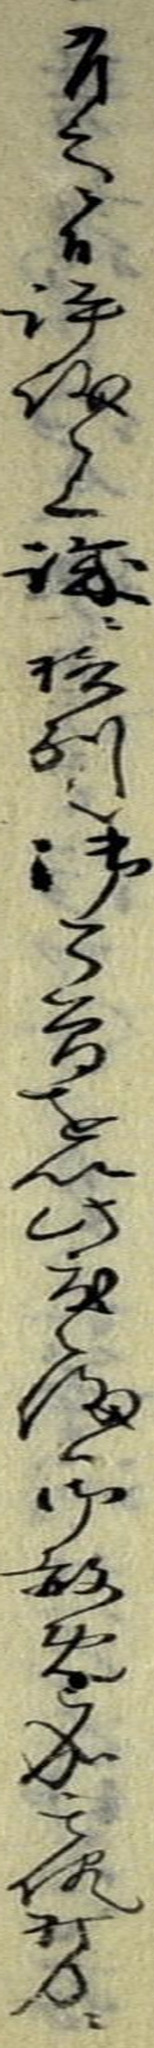有之に付評議之上誠に格別之御了簡を以此度之儀は御赦免被成其侭村方に
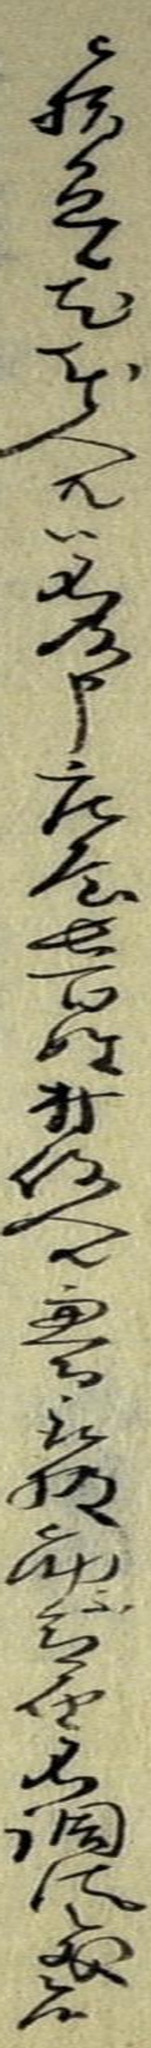被指置候尤本人共は不及申庄屋長百姓村役人共兼而取扱筋参届不調法之義に候
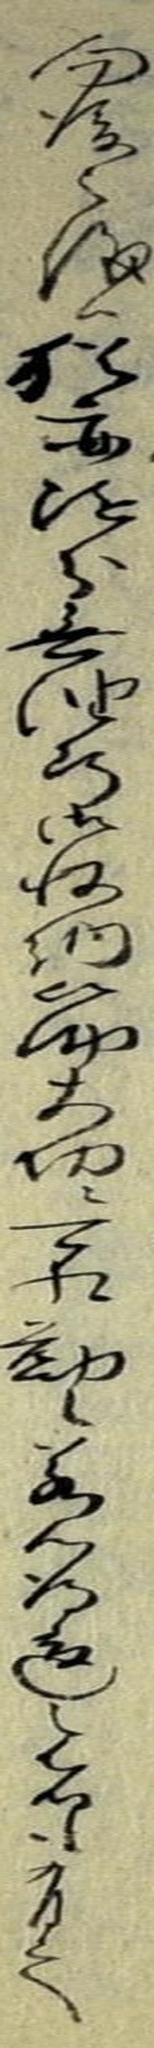向後之儀は猶亦随分無油断御収納筋大切に可相勤候若心得違之者も有之
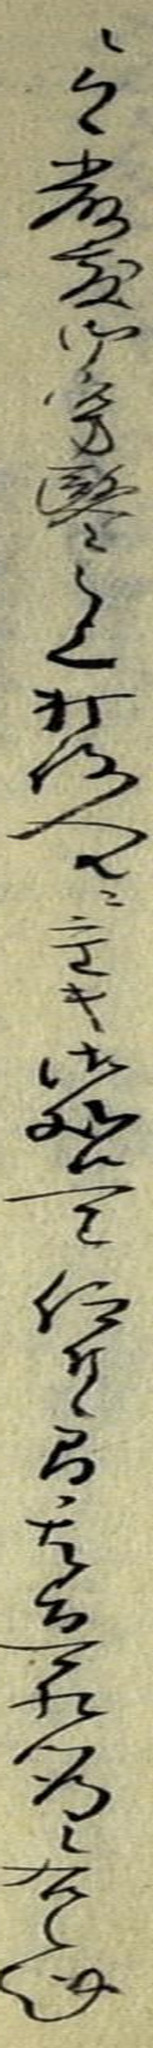候はゝ厳敷御穿鑿之上村役人共に重き御咎可被仰付候間其旨可相心得候右之趣
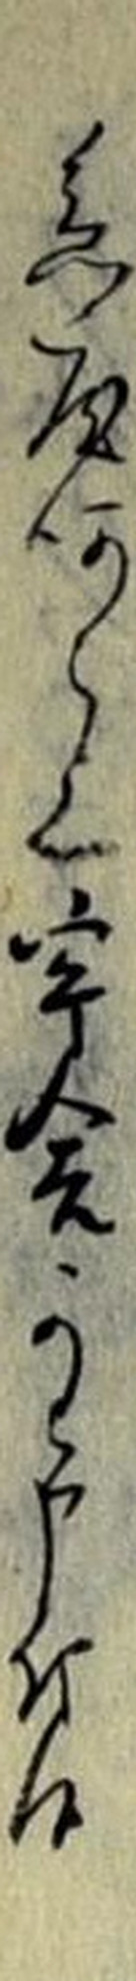急度呵之上牢舎可被申付候
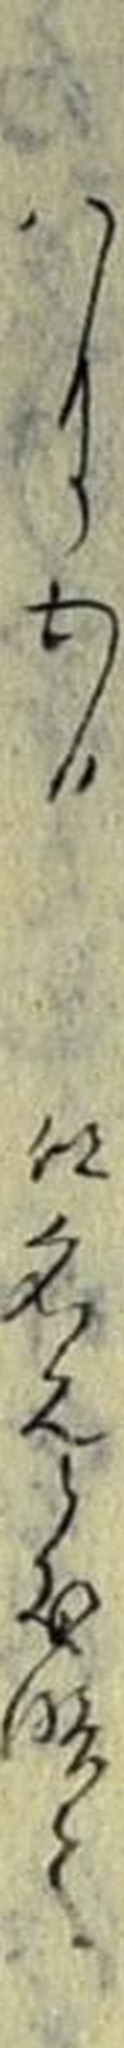八月五日但名元之義略之
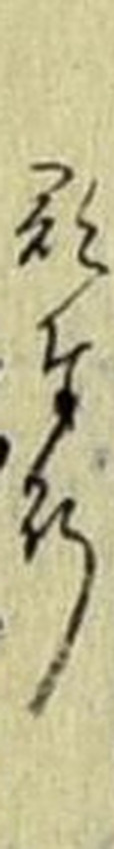郡奉行
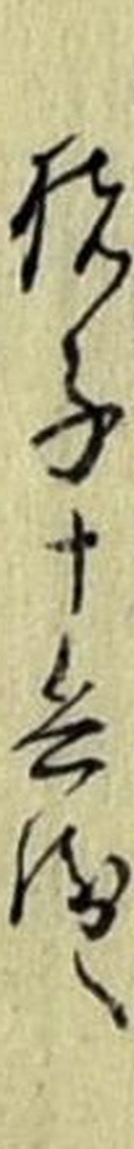猪子十兵衛へ
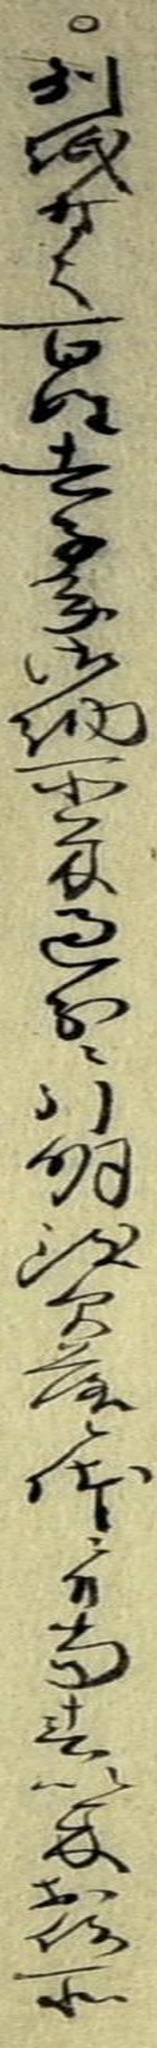〇別紙村之百姓去子年御納所米過分に引明致欠落候体に付当春以来於役所
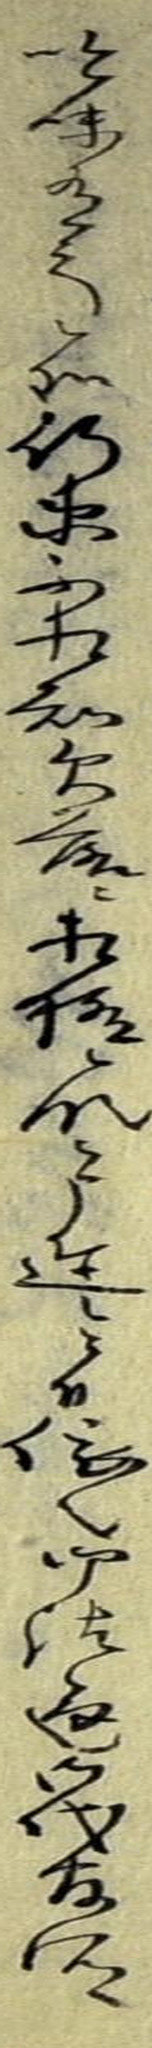吟味有之候処約束不相知欠落に相極候処被申達候に付依之御法之通御代官所へ
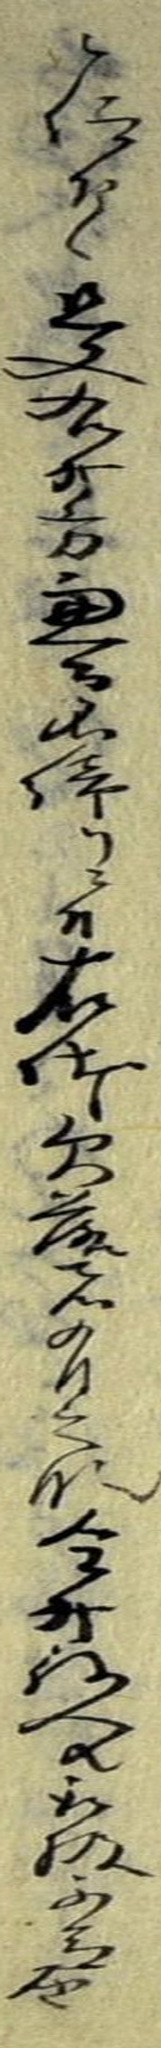被仰付候且又右村方兼而不締りに付右体欠落者有之段全村役人共取扱不参届

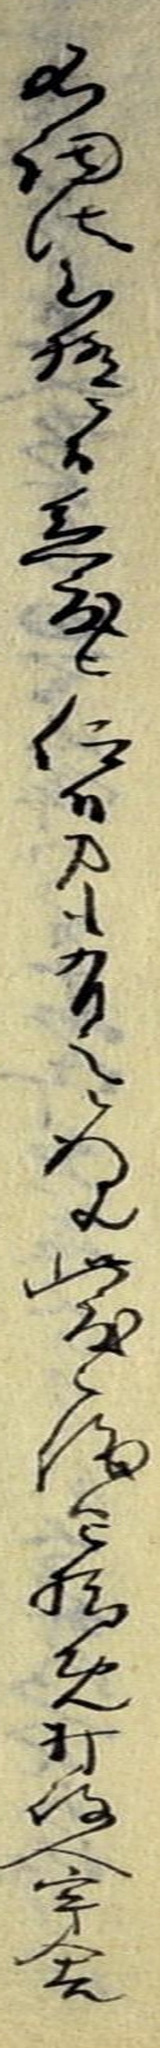不調法至極に付急度被仰付方も有之候得共此度之儀は被指免村役人牢舎
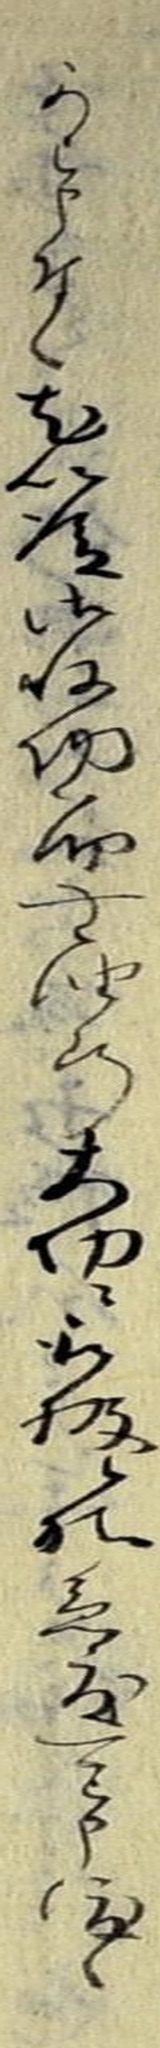可被申付候尤以後御収納筋無油断大切に取扱候様急度可被申渡候
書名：命令之部 二
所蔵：福井県文書館 Fukui Prefectural Archives
